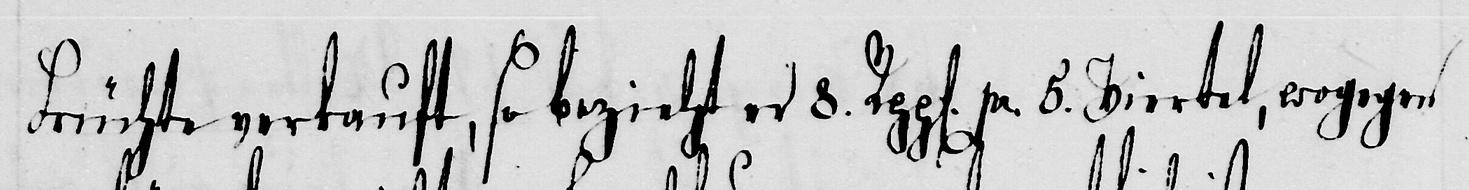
Früchte verkauft, so bezieht er 8. Rpp[en]. pr. Viertel,
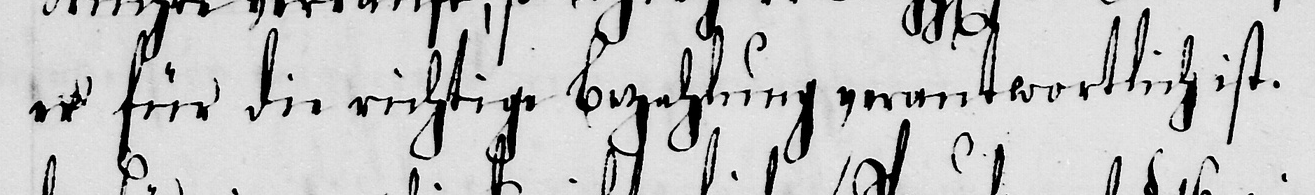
er für die richtige Bezahlung verantwortlich ist.
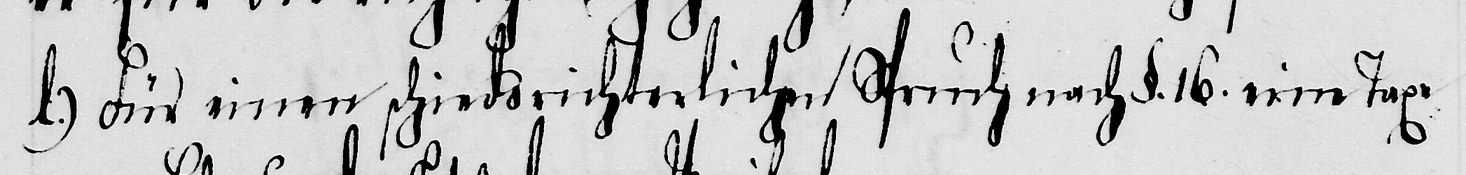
l.) Für einen schiedsrichterlichen Spruch nach §.16. eine Taxe
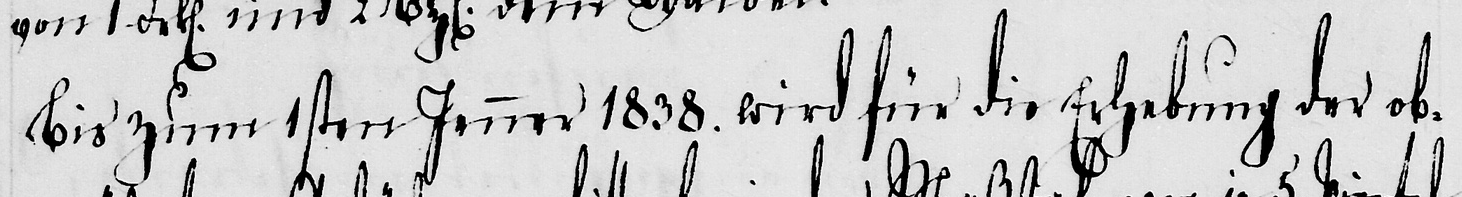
Bis zum 1sten Jenner 1838. wird für die Erhebung der ob¬
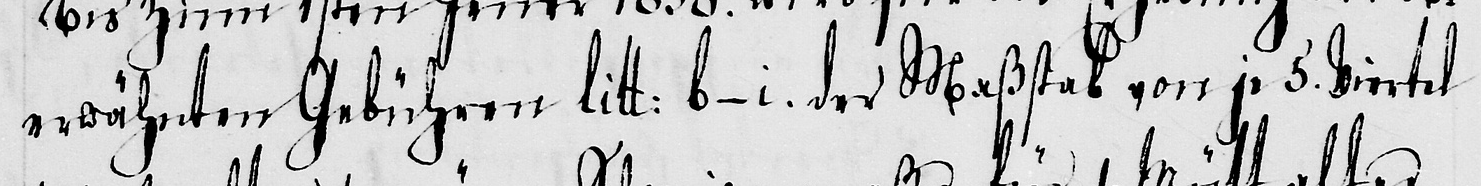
erwähnten Gebühren litt: b–i. der Maßstab von je. 5. Viertel
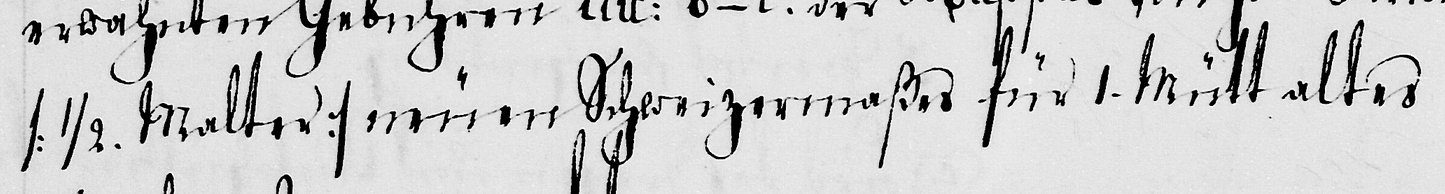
[1/2. Malter] neuen Schweizermaßes für 1. Mütt altes
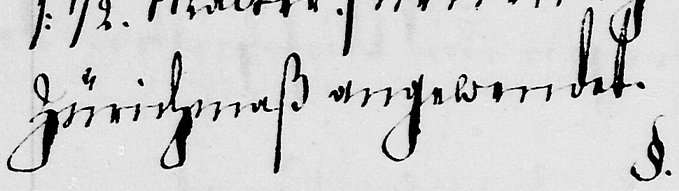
Zürichmaß angewendet.
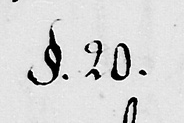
§.20.
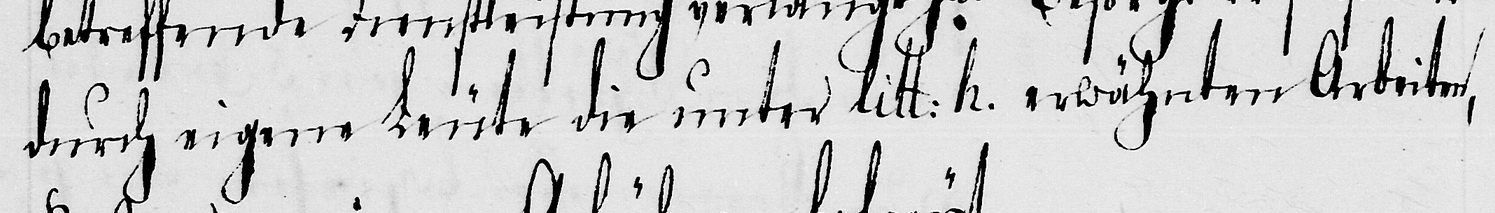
durch eigene Leute die unter litt: h. erwähnten Arbeiten,
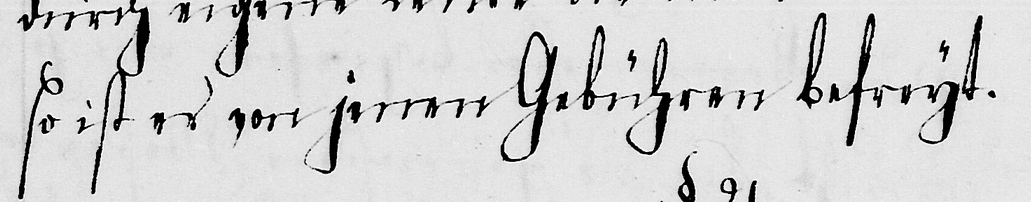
so ist er von jenen Gebühren befreyt.
